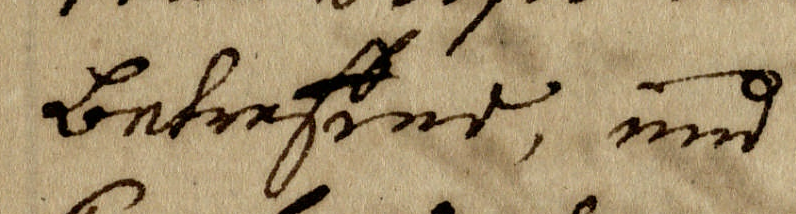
betreffend, und
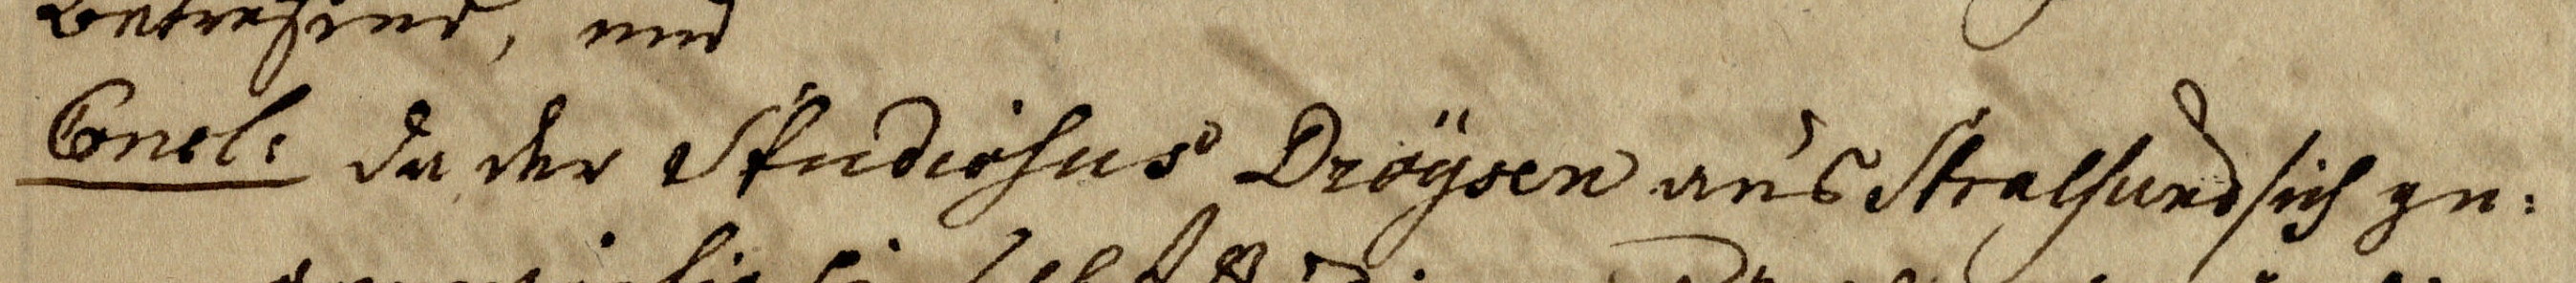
Concl. Da der Studiosus Droÿsen aus Stralsund sich ge¬
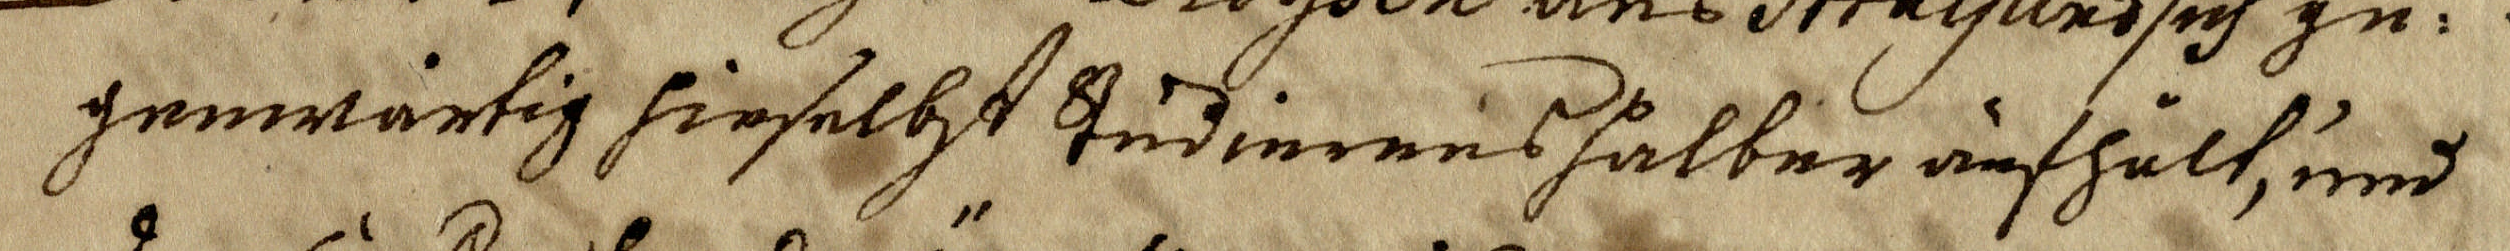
genwärtig hieselbst Studierens halber aufhält, und
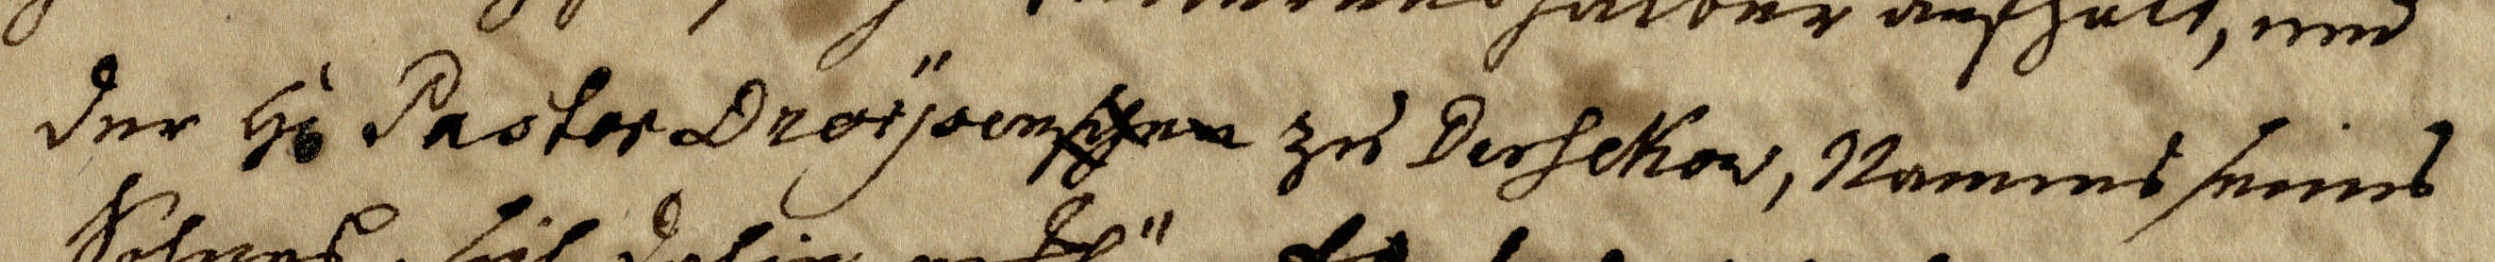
der H Pastor Droÿsen zu Dersekow, Namens seines
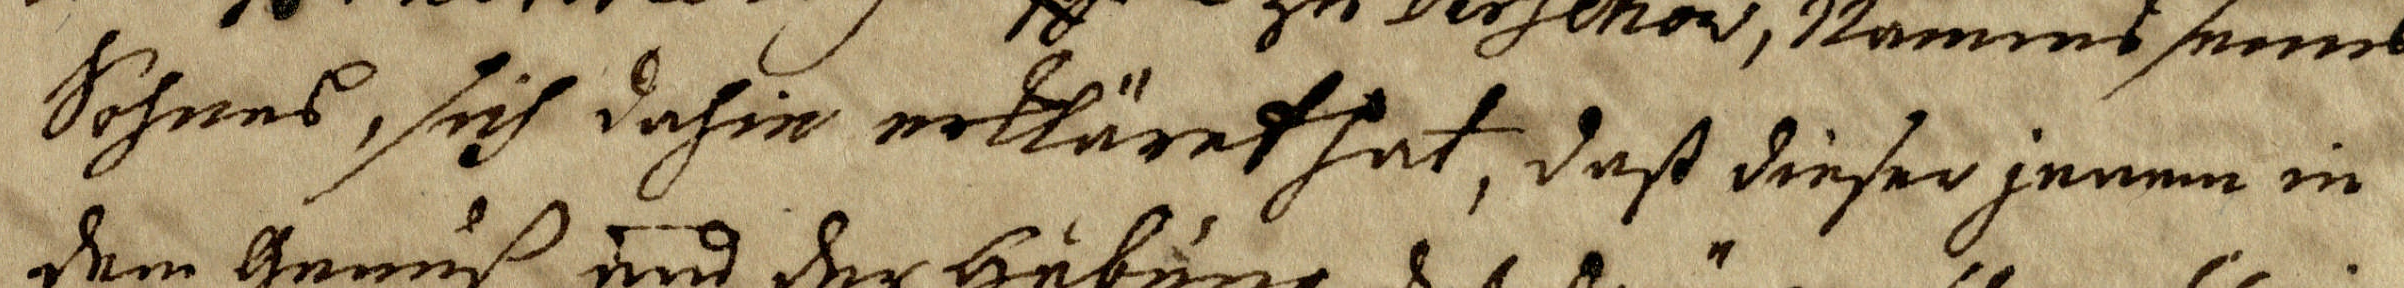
Sohnes, sich dahin erklärethat, daß dieser jenem in
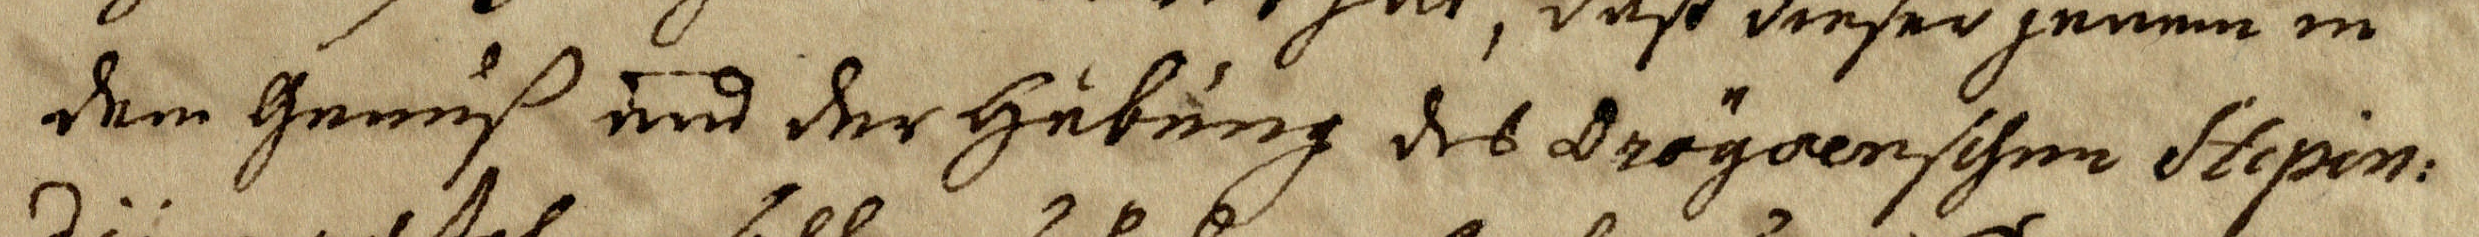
dem Genuß und der Hebung des Droÿsenschen Stipen¬
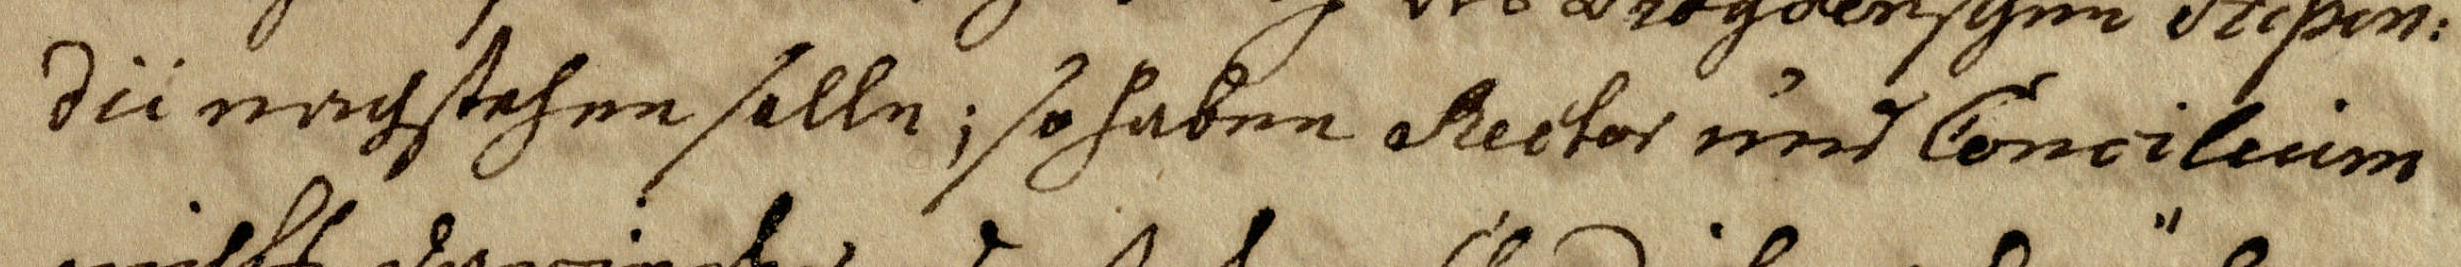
dii nachstehen solle, so haben Rector und Concilium
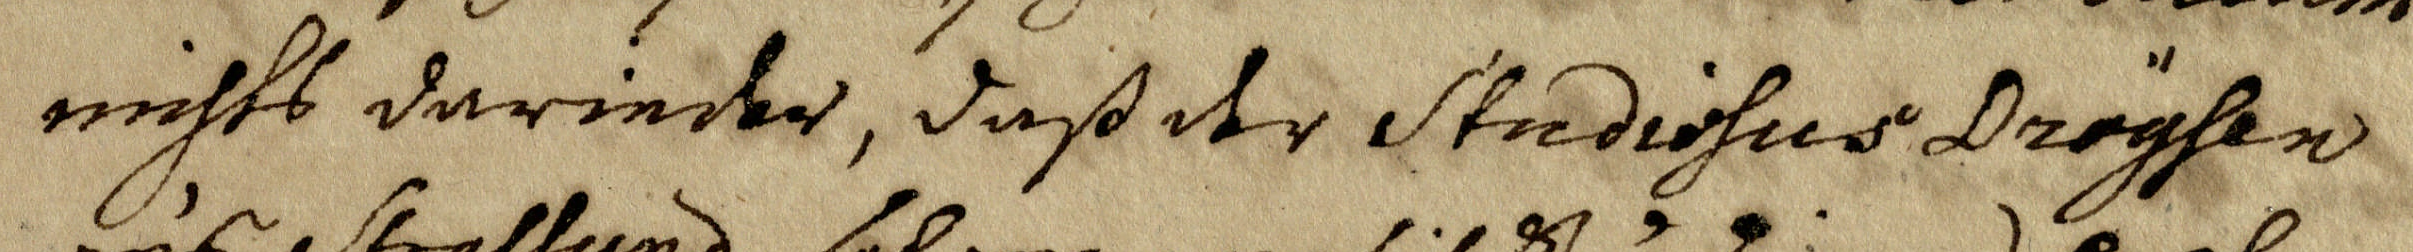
nichts dawieder, daß der Studiosus Droÿsen
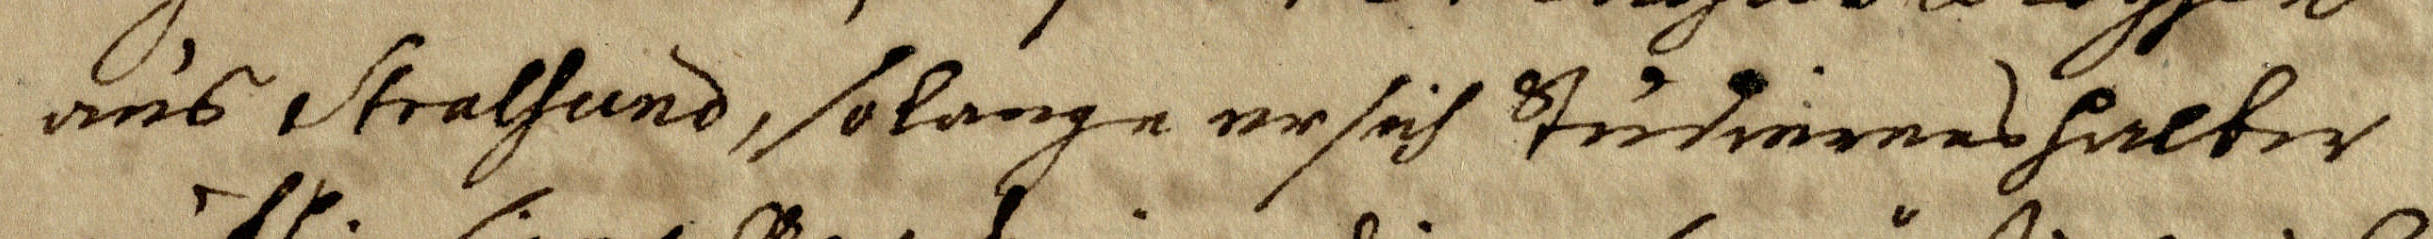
aus Stralsund, so lange er sich Studierens halber
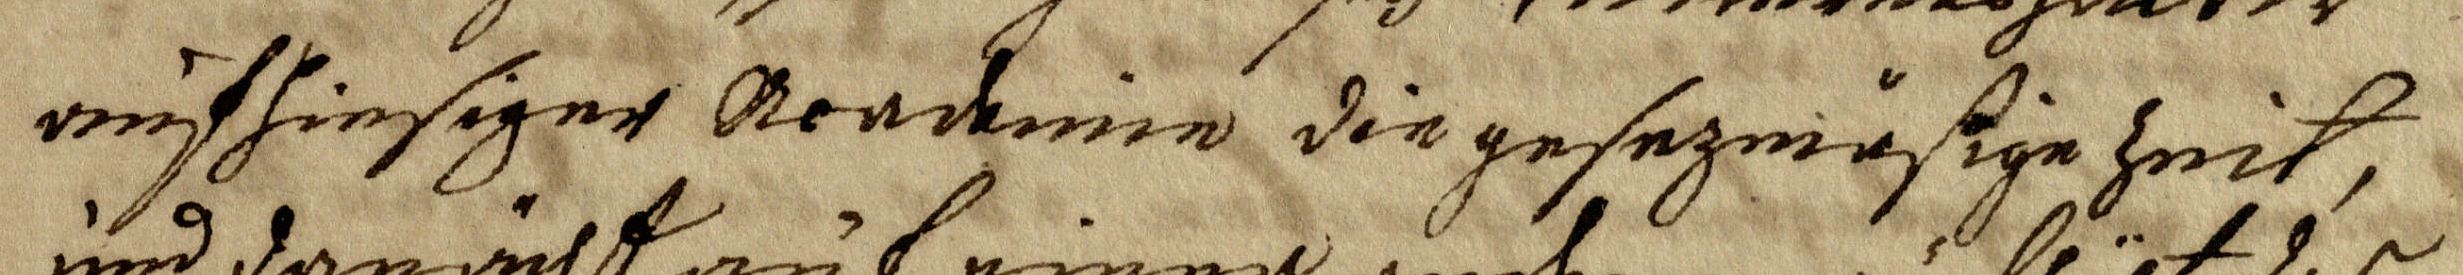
auf hiesiger Academie die gesezmäßige Zeit,
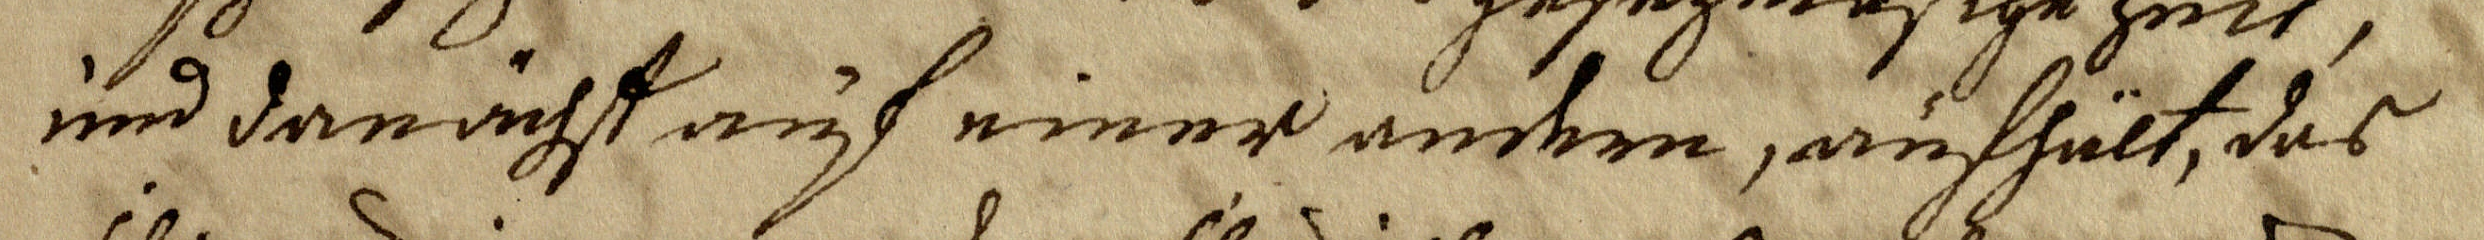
und danächst auf einer andern, aufhält, das
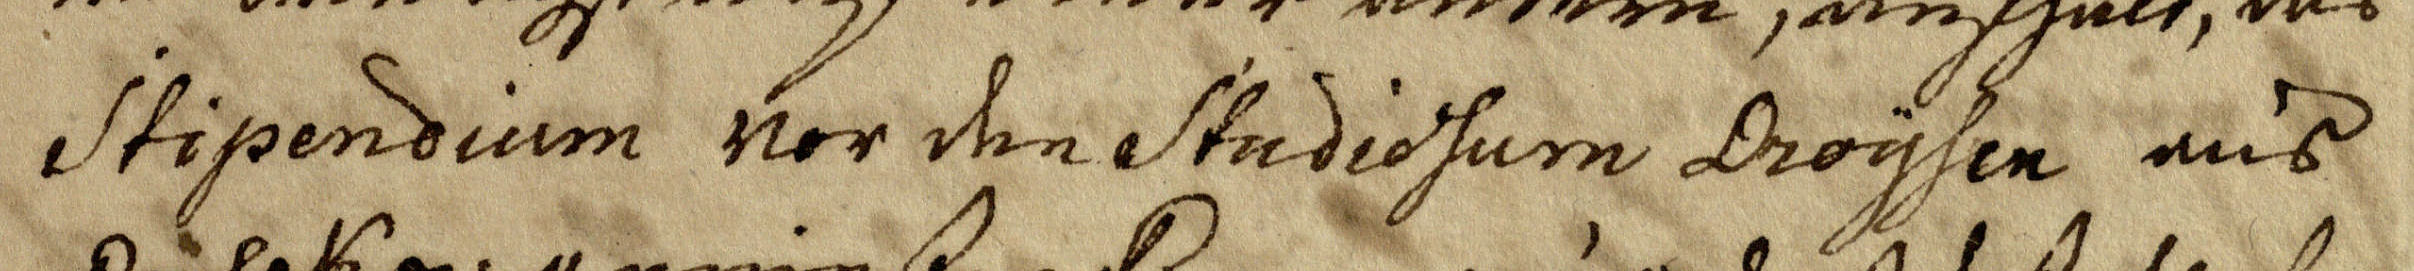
Stipendium vor dem Studiosum Droÿsen aus
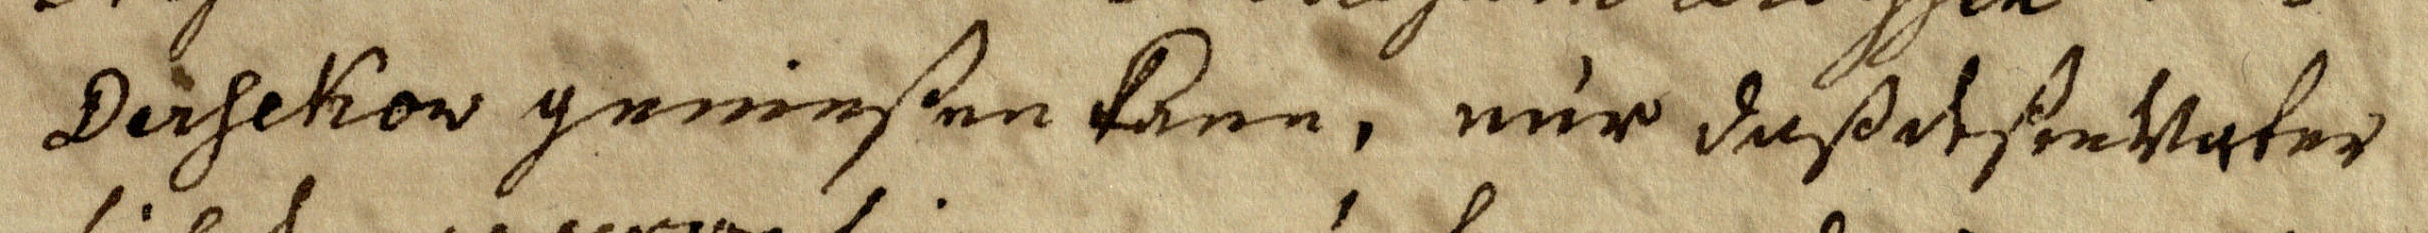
Dersekow gemießen kann, nur daß deßen Vater
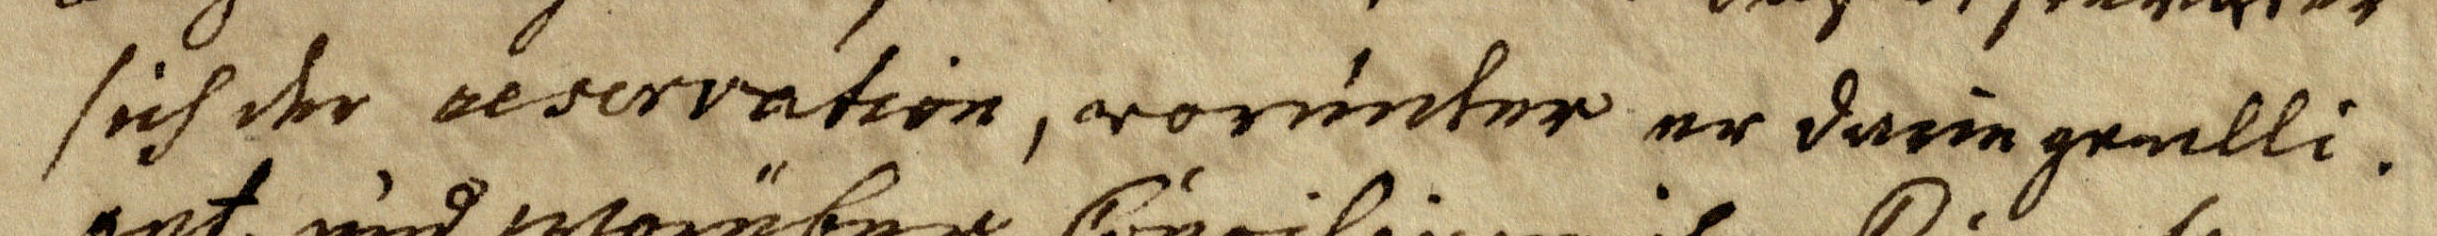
sich der reservation, worunter er darin gewilli¬
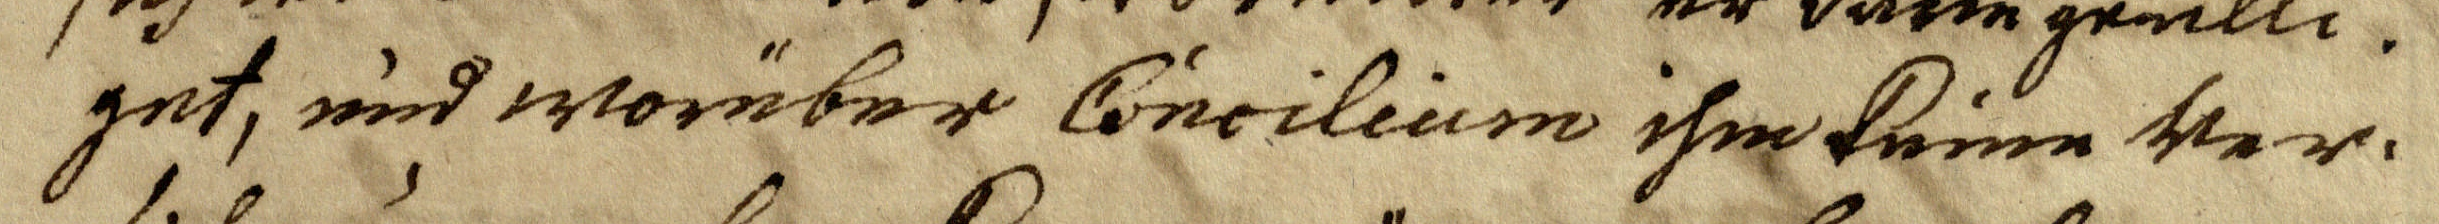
get, und worüber Concilium ihm keine Ver¬
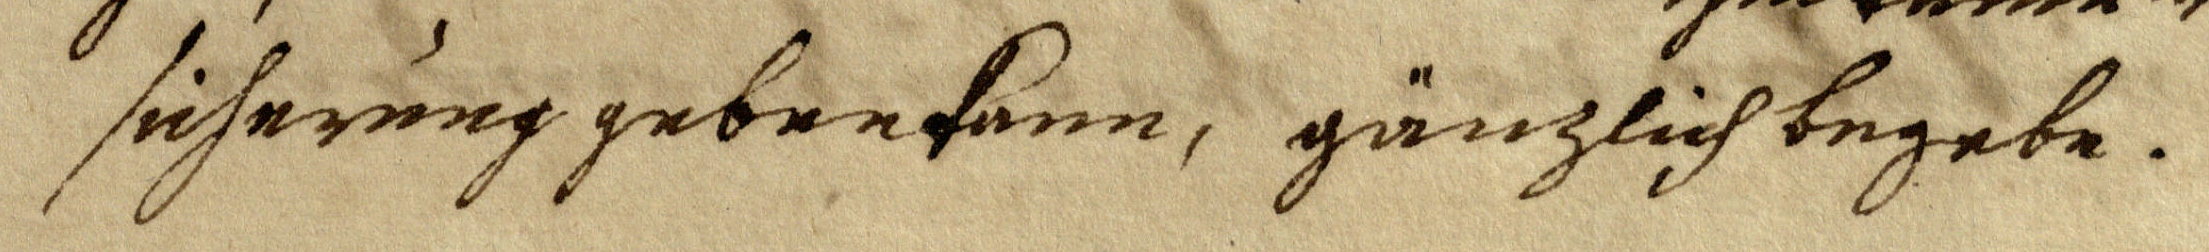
sicherung geben kann, gänzlich begebe.
